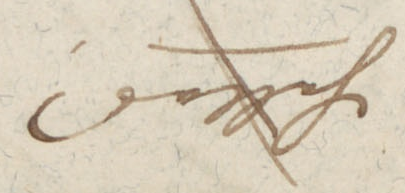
materiellen
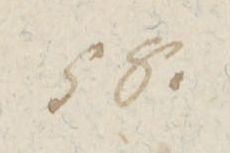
58.
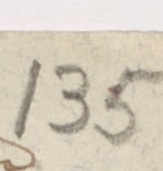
135
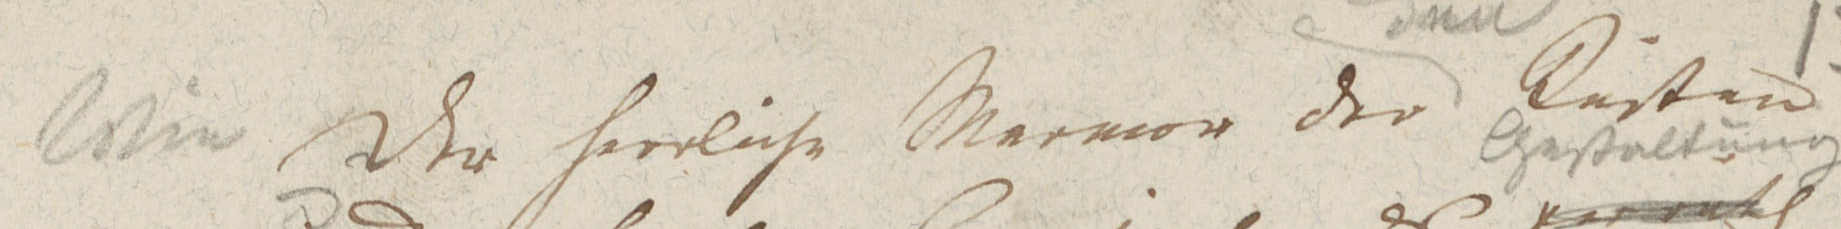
Wie Dder herrliche Marmor der dieen Küsten
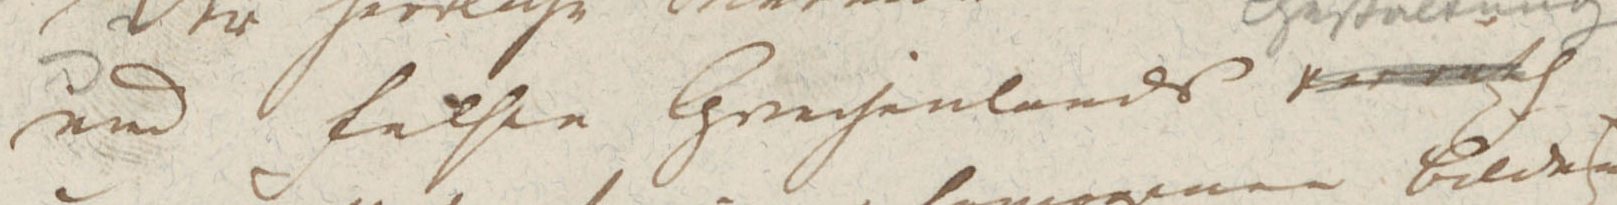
und Felsen Griechenlands verräth
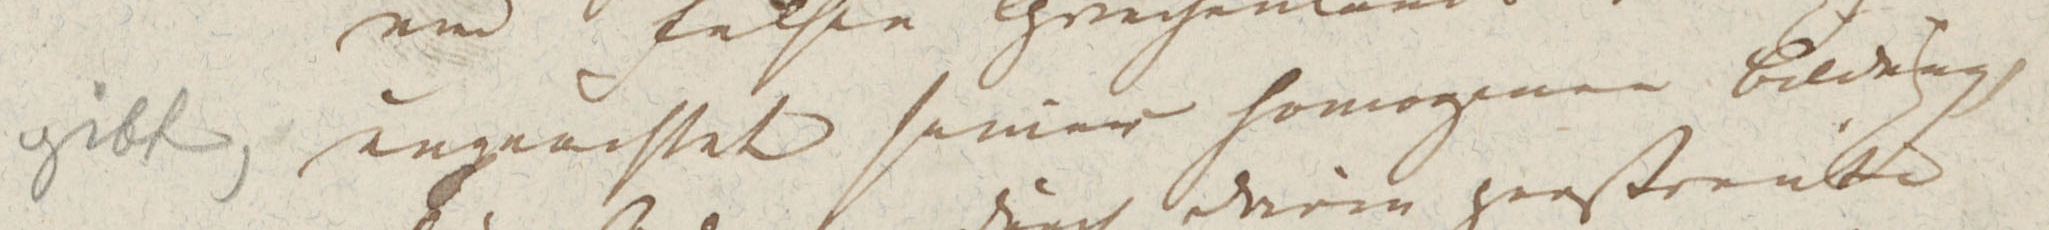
gibt, ungeachtet seiner homogenen Bildung,
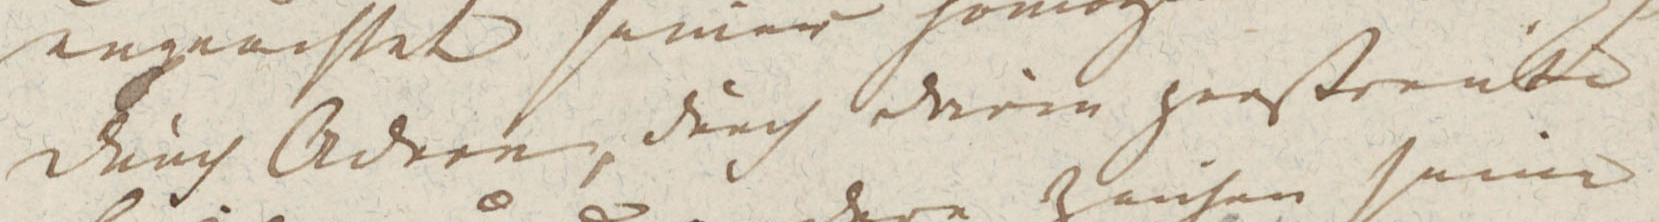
durch Adern, durch darin zerstreute
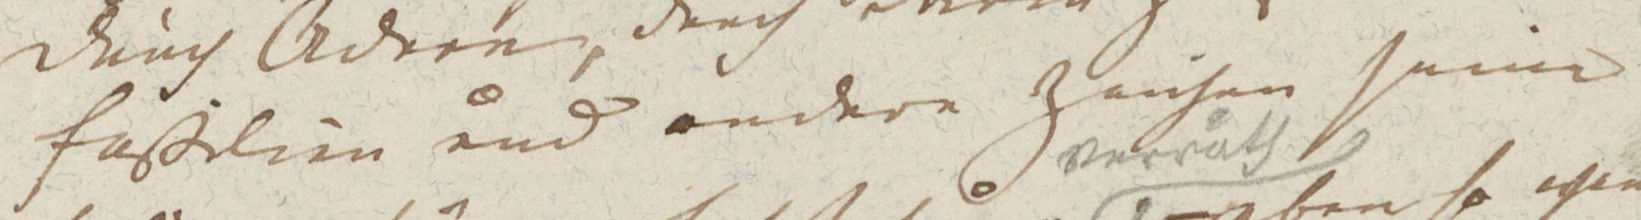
Fossilien und andere Zeichen seine
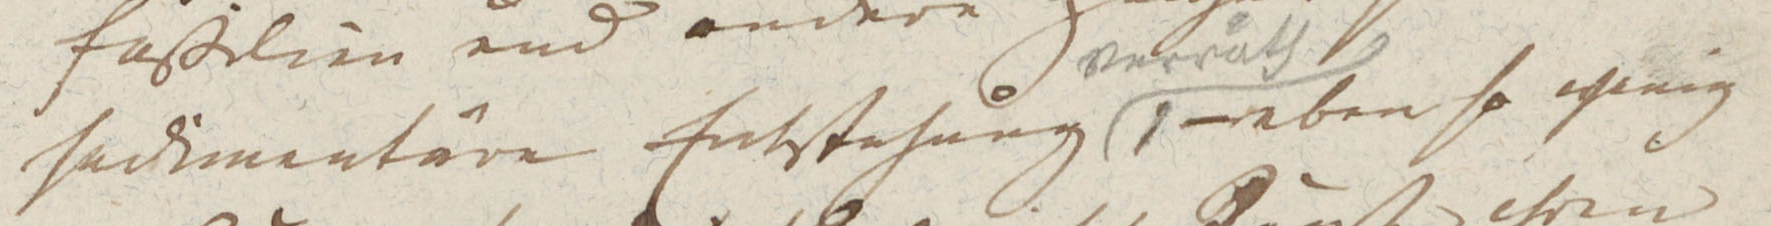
sedimentäre Entstehung verräth; – eben so wenig
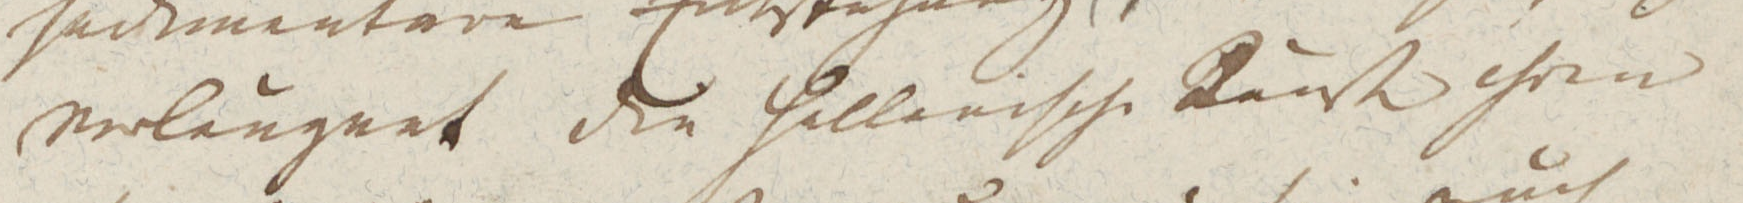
verleugnet die Hellenische Kunst ihren
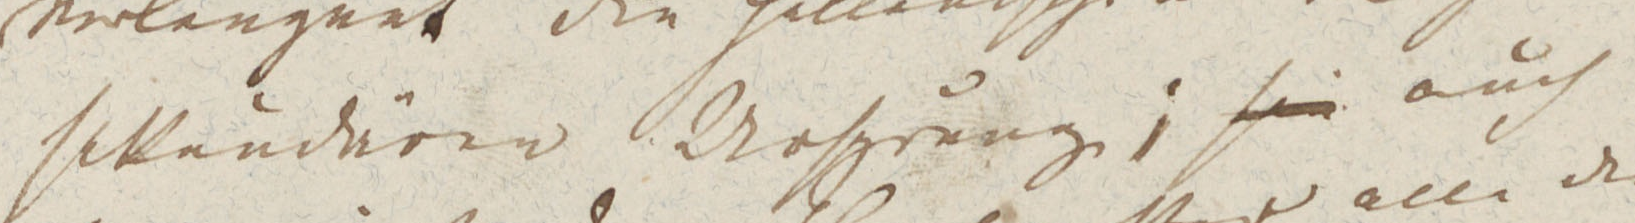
sekundären Ursprung; sie auch
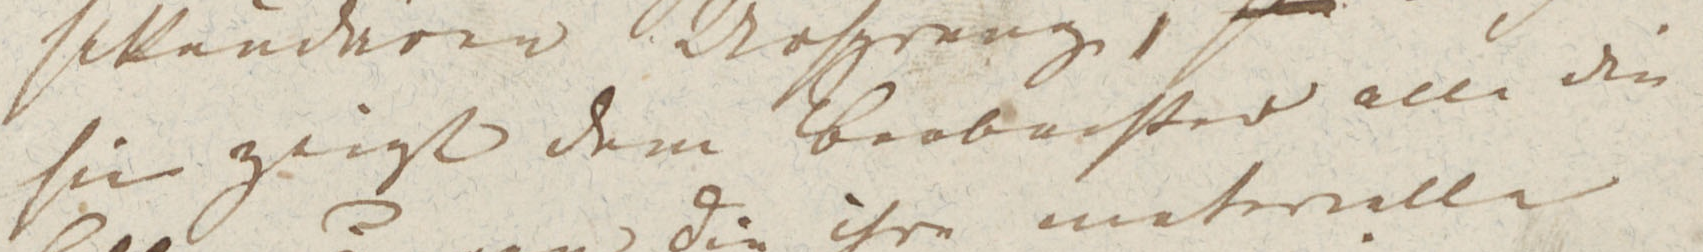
sie zeigt dem Beobachter alle die
